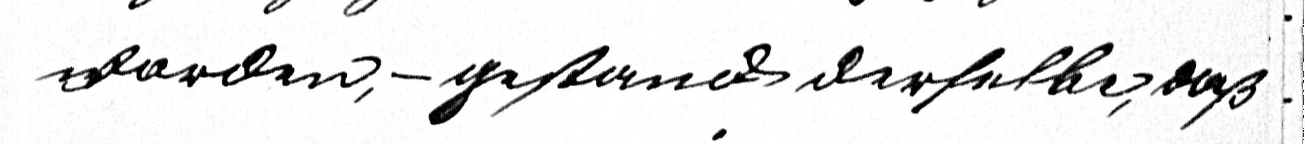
worden, - gestand derselbe, daß
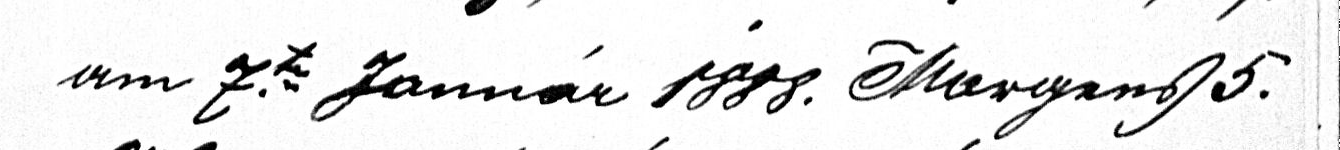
am 7.ten Január 1888. Morgens 5.
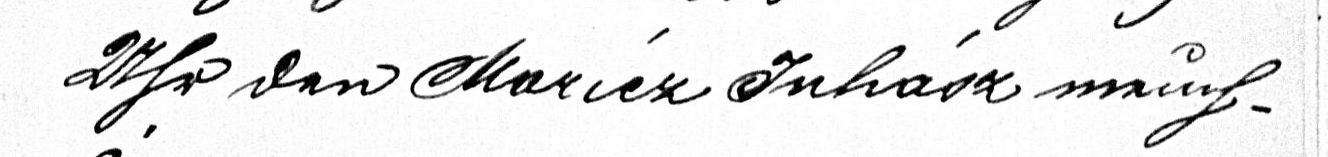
Uhr den Morcéz Inhász meuch¬
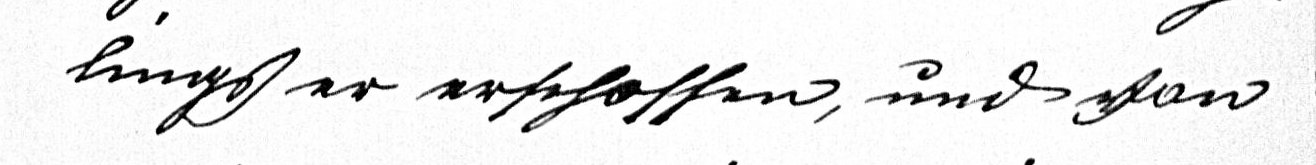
lings er erschossen, und von
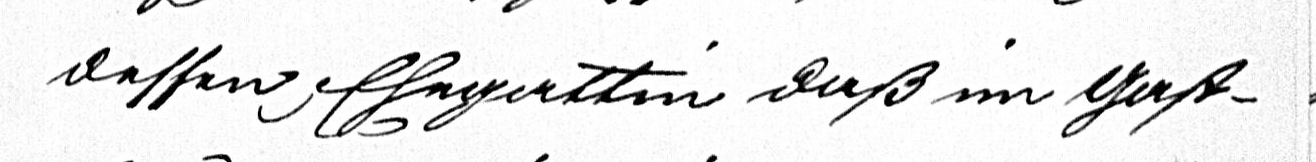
dessen Ehegattin daß im Gast¬
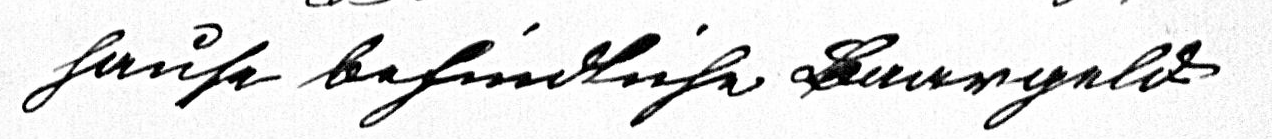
hause befindliche Baargeld
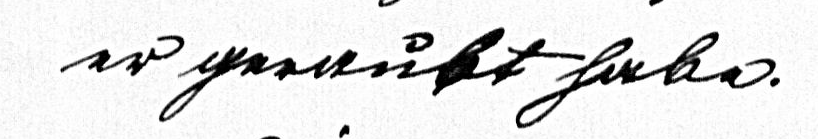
er geraubt habe.
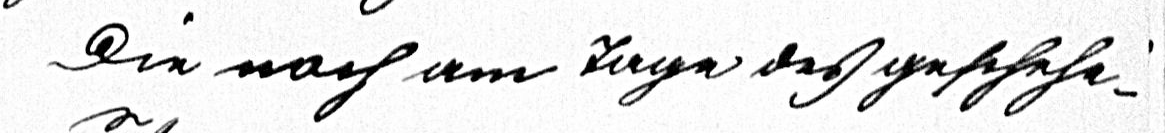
Die noch am Tage des geschehe¬
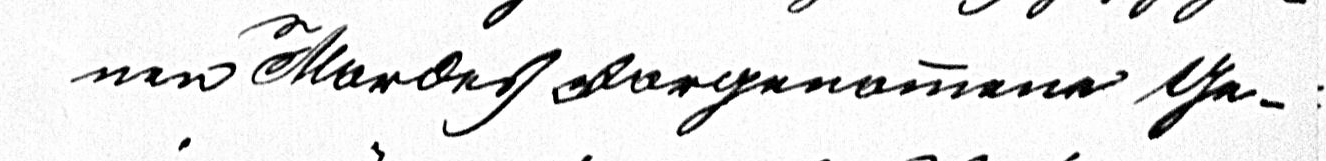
nen Mordes vorgenommene Ge¬
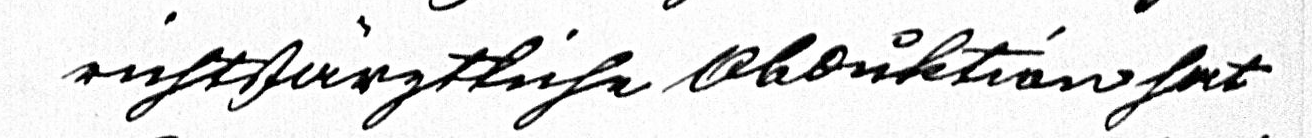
richtsärztliche Obduktion hat
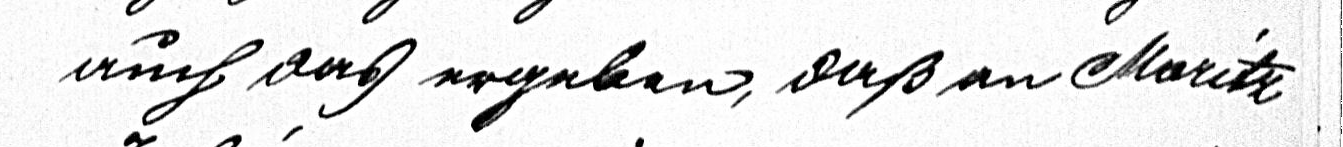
auch das ergeben, daß an Moritz
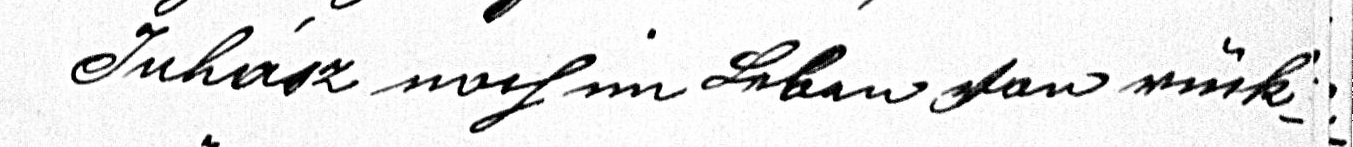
Inhász noch im Leben von rück¬
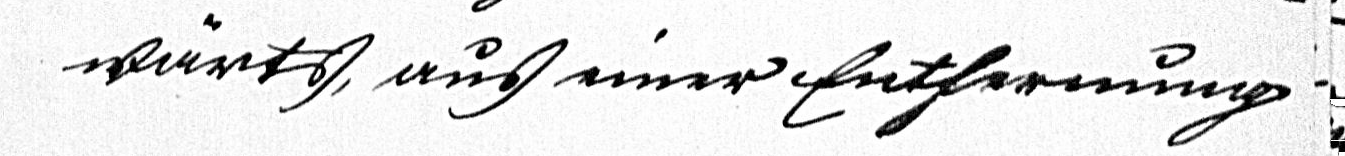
wärts, aus einer Entfernung
